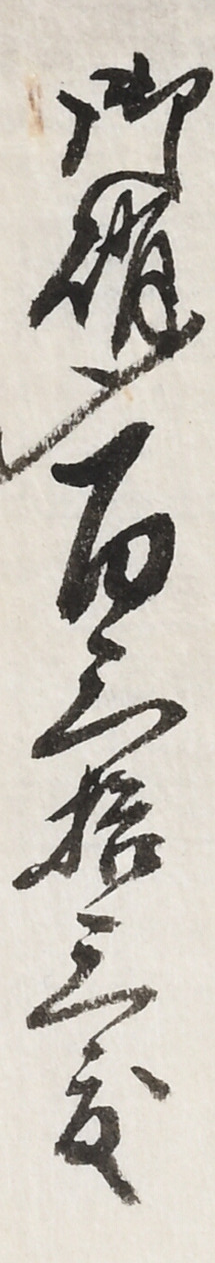御賄〆百三拾三度
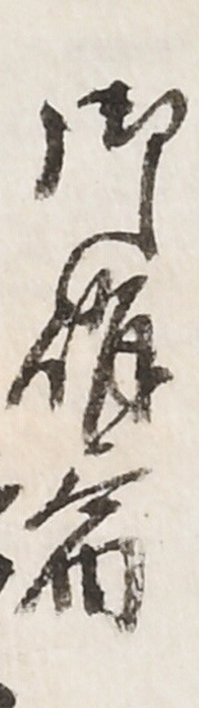御賄宿
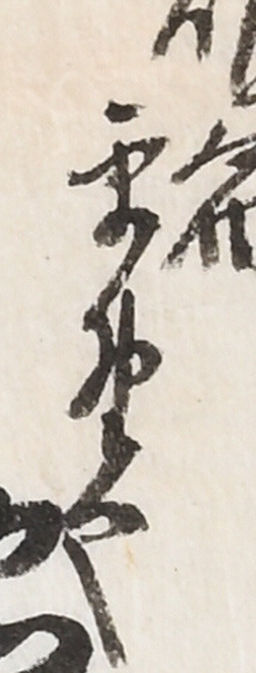平野屋
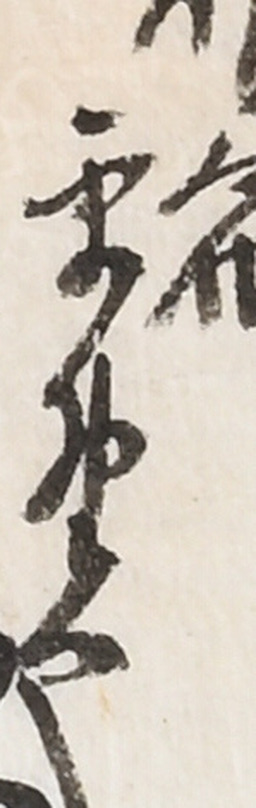平野屋
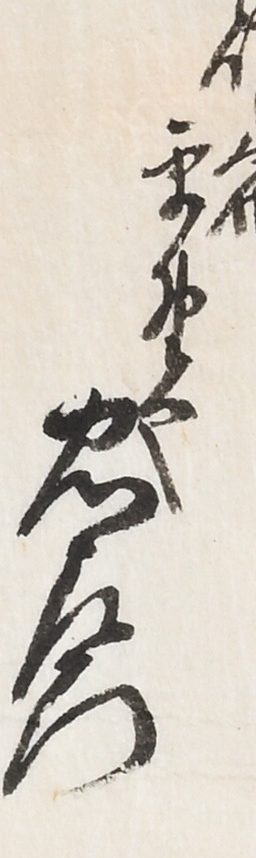忠左衛門
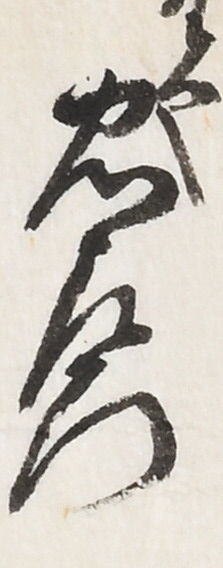忠左衛門
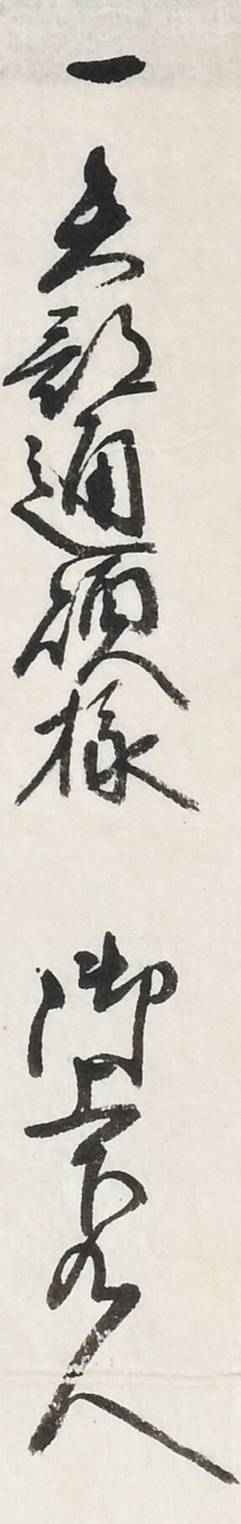一矢部通碩様御上下九人
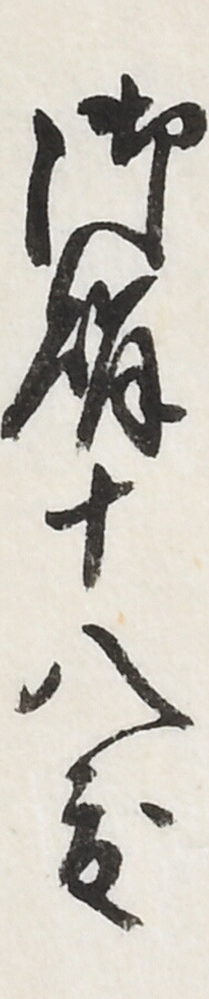御賄十八度
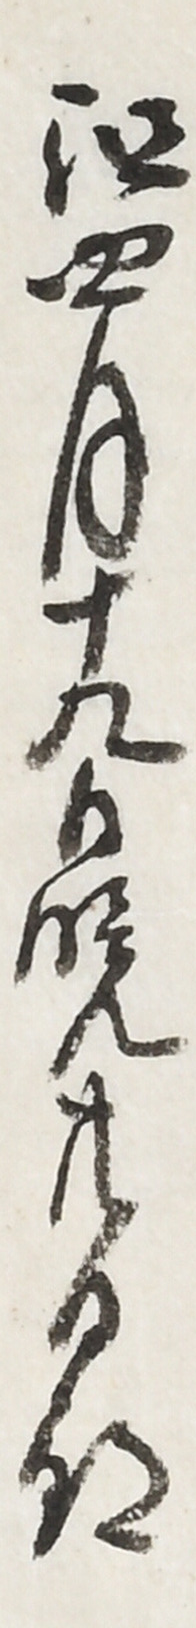但四月十九日晩廿日朝
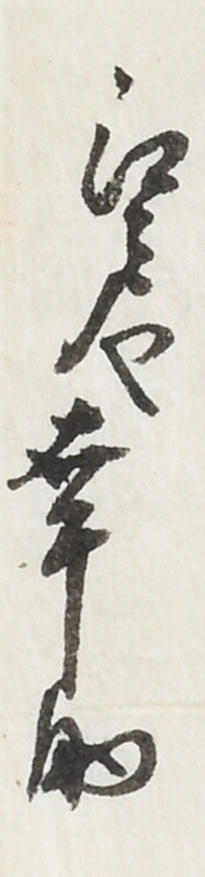江戸ヤ幸助
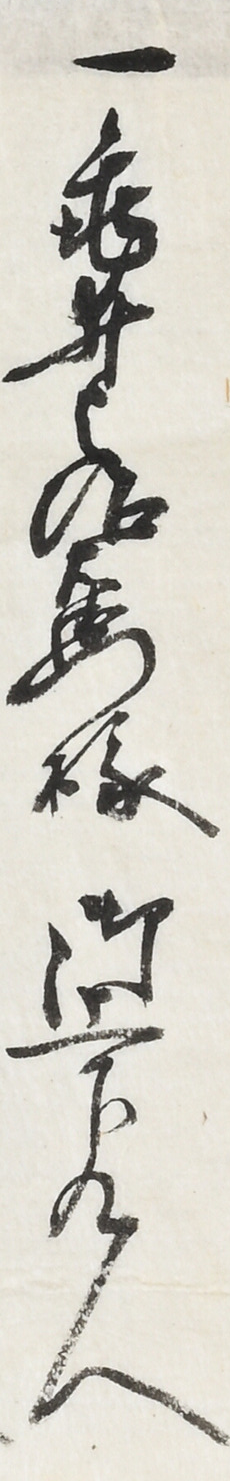一亀井治右衛門様御上下九人
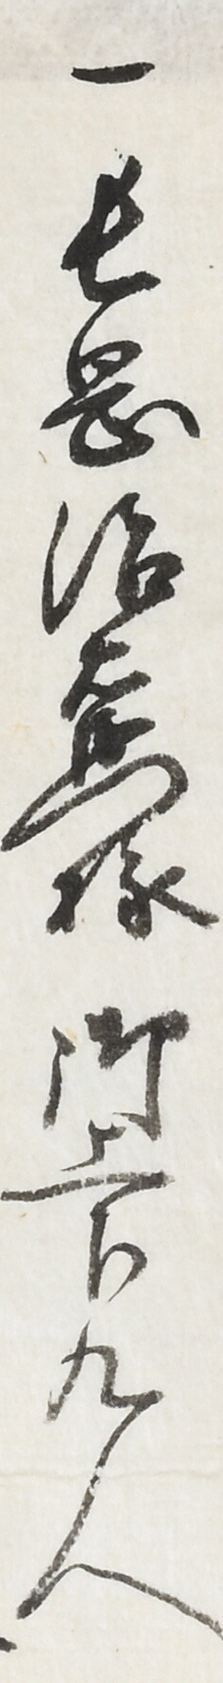一長岡治右衛門様御上下九人
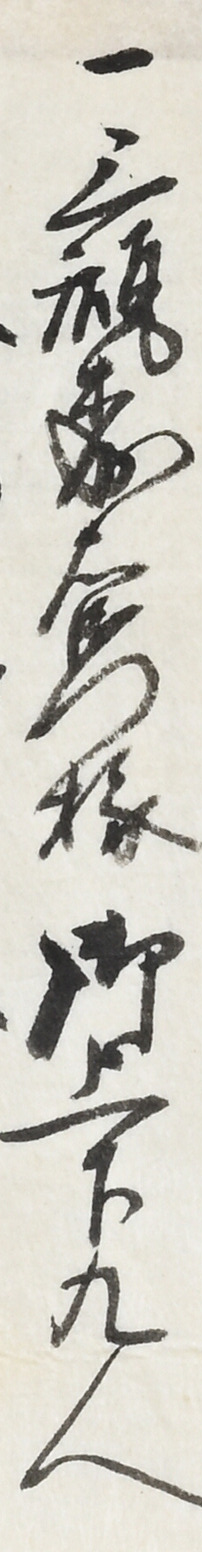一三瓶森右衛門様御上下九人
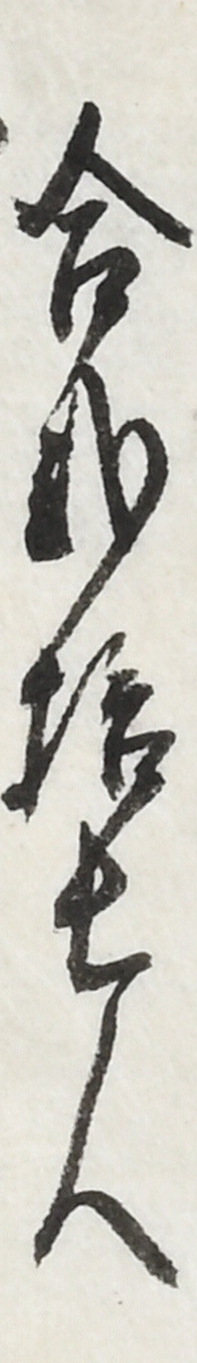合弐拾七人
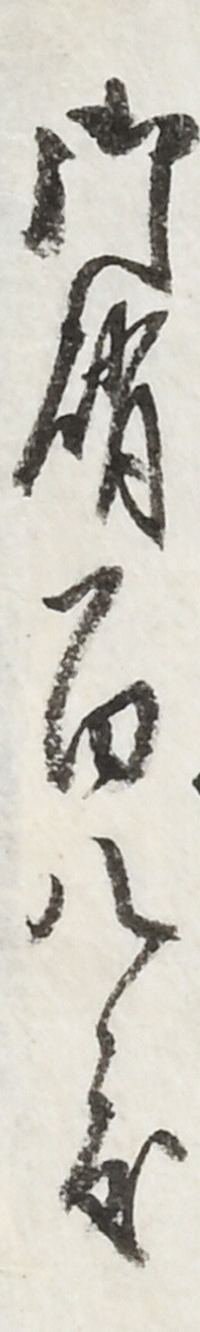御賄百八度
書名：御巡見様町方御泊相数書上覚
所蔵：伊那市立高遠町図書館・合同会社AMANE
